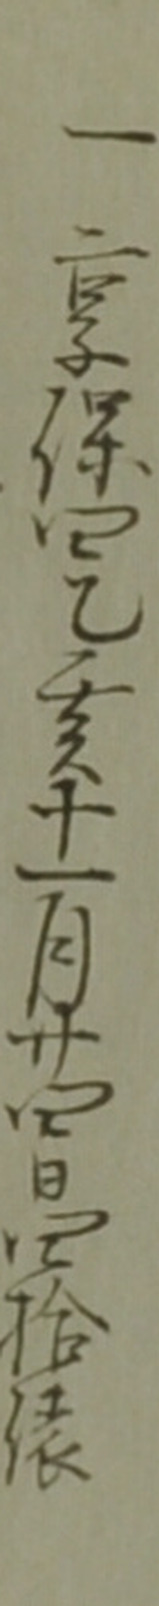一享保四乙亥十一月廿四日四拾俵
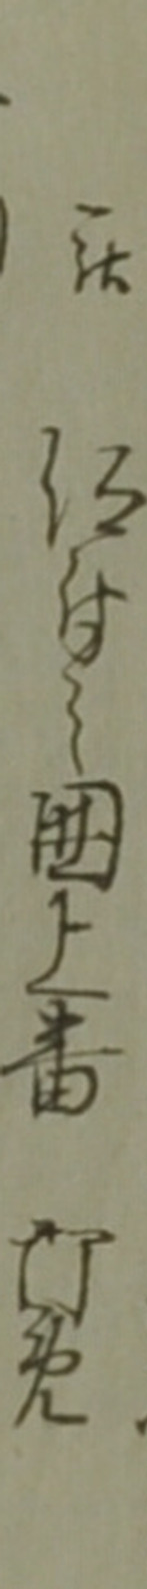被仰付之囲上番御免
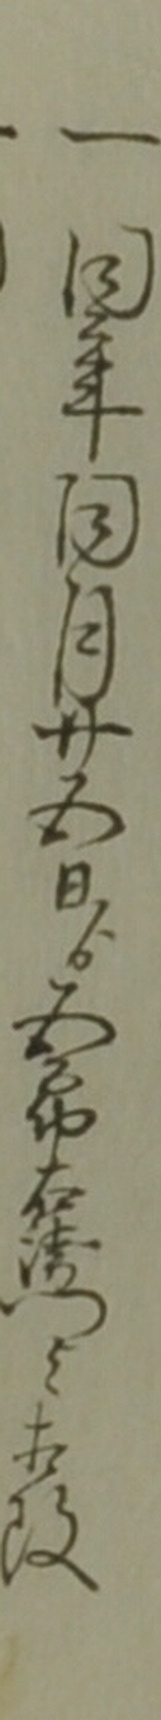一同年同月廿五日ゟ五郎右衛門与相改
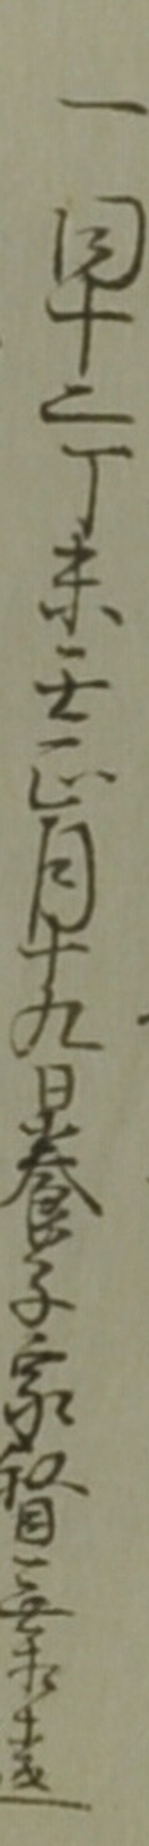一同十二丁未閏正月十九日養子家督無相違
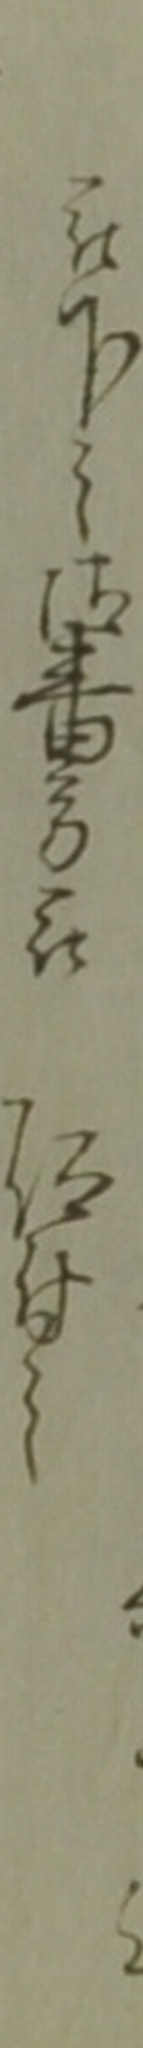被下之御番方被仰付之
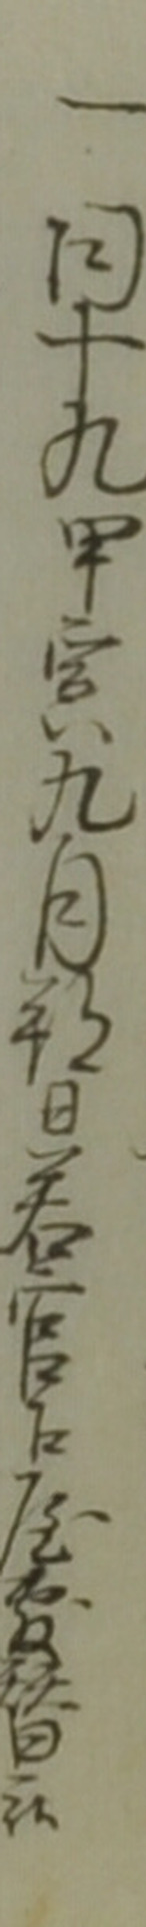一同十九甲寅九月朔日若宮江屋敷替被
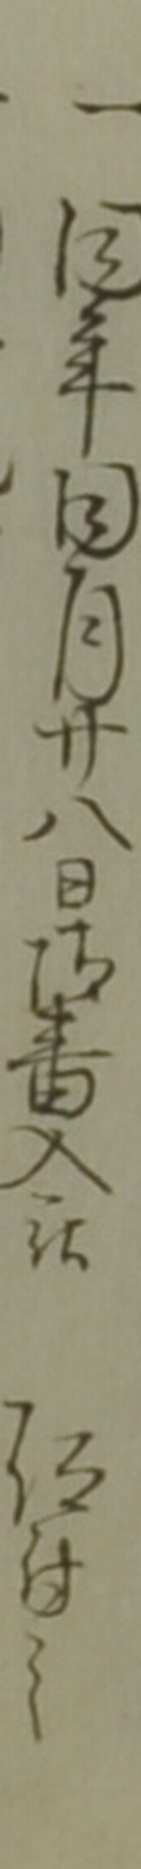一同年同月廿八日御番入被仰付之
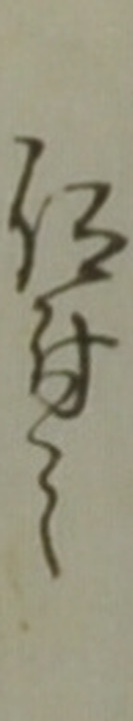仰付之
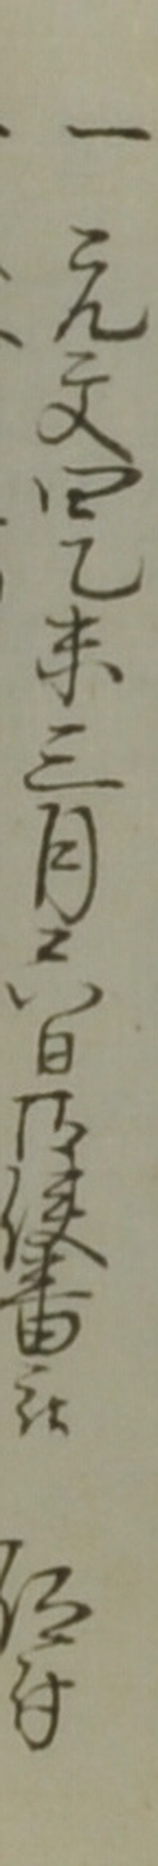一元文四乙未三月六日御使番被仰付
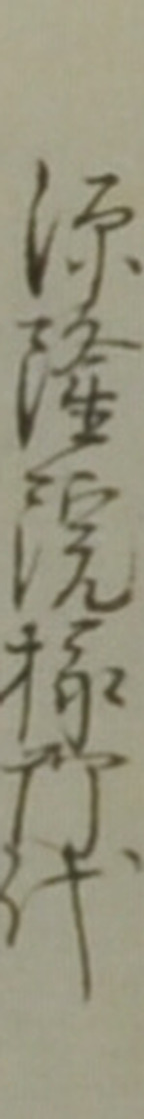源隆院様御代
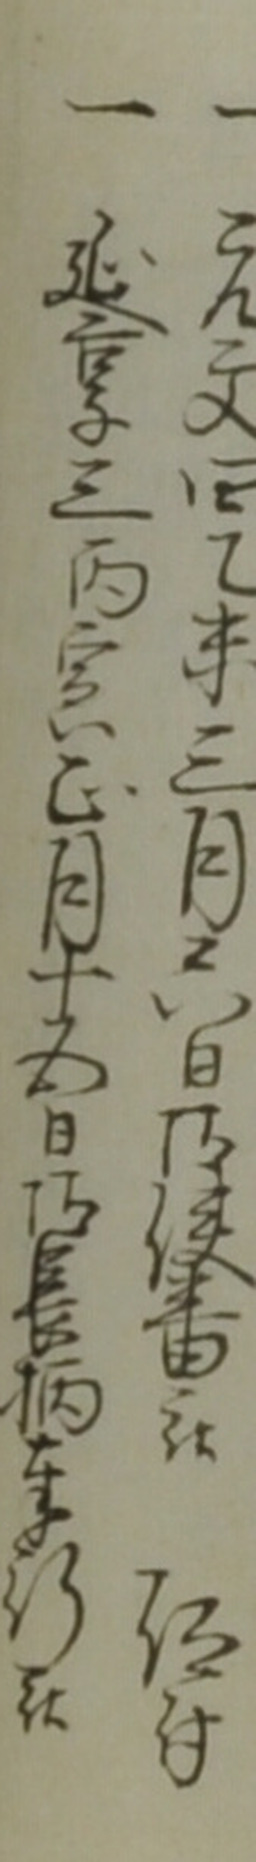一延享三丙寅正月十五日御長柄奉行被
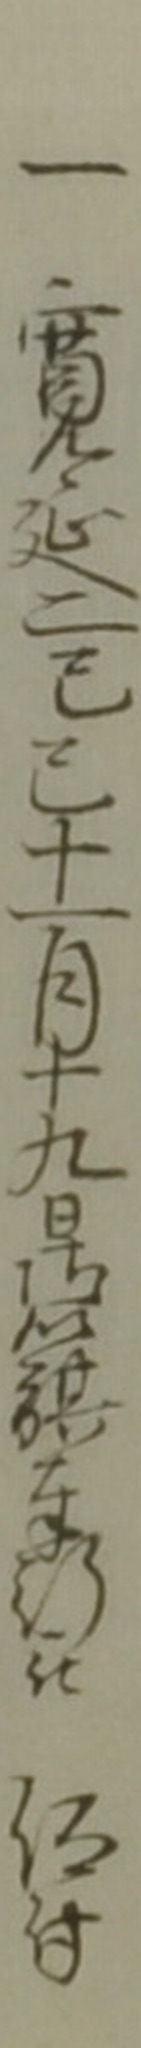一寛延二己巳十一月十九日御籏奉行被仰付
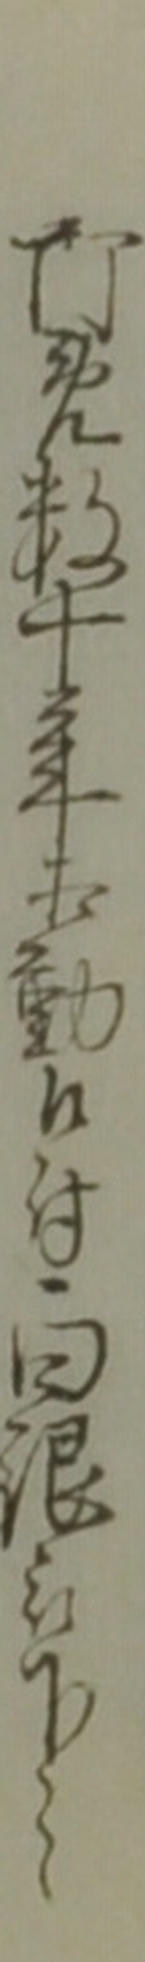御免数十年相勤候付白銀被下之
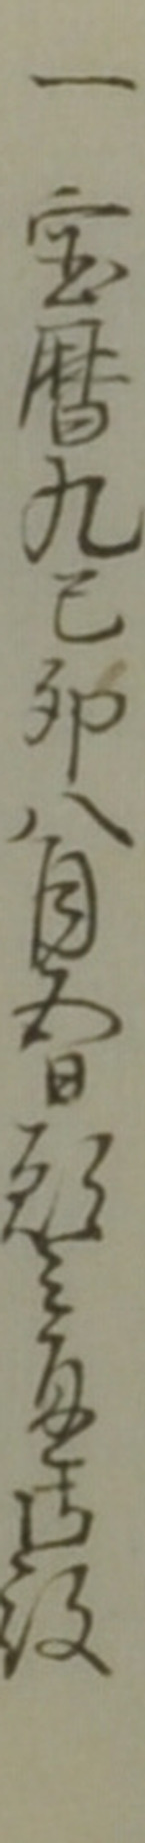一宝暦九己卯八月五日願之通御役
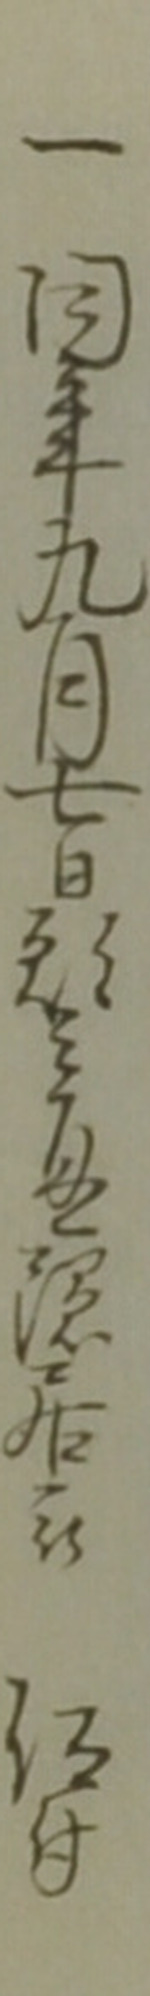一同年九月七日願之通隠居被仰付
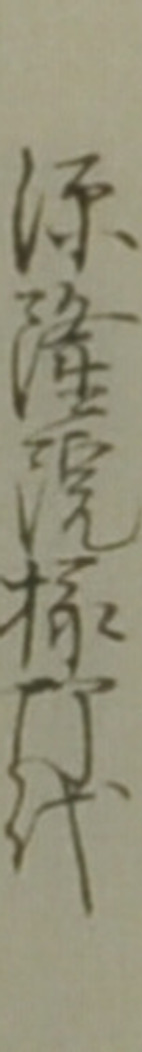源隆院様御代
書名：給人諸士勤仕録（三）
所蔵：伊那市立高遠町図書館・合同会社AMANE
